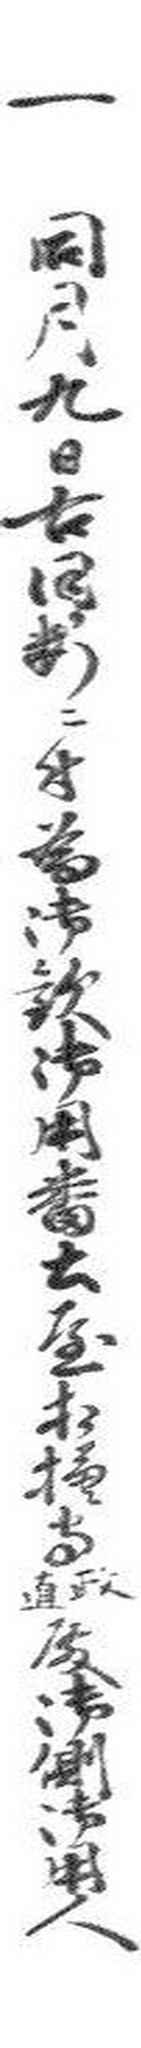一同月九日右同断ニ付為歓御用番土屋相模守政直殿御側御用人
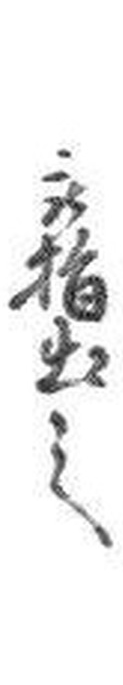被指出之
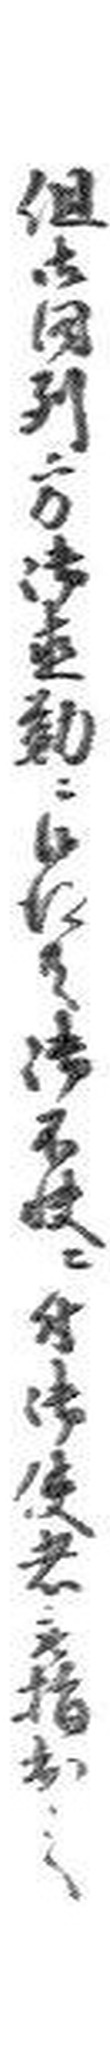但御同列方御直勤ニ候得共御不快御使者被指出之
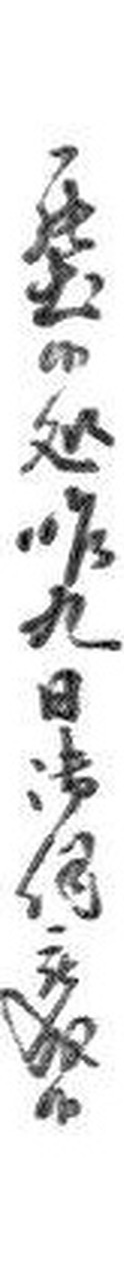罷出候処昨九日御伺被成候
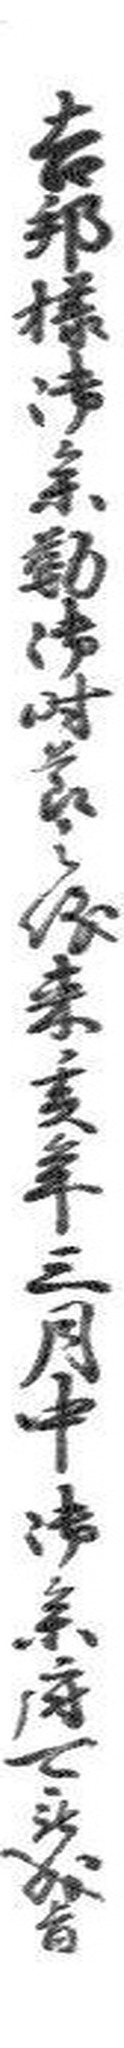吉邦様御参勤御時節之儀来亥年三月中御参府可被成旨
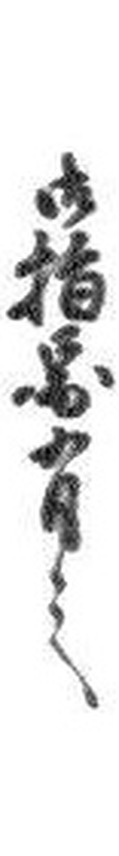御指図有之
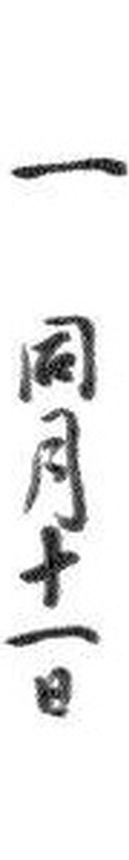一同月十一日
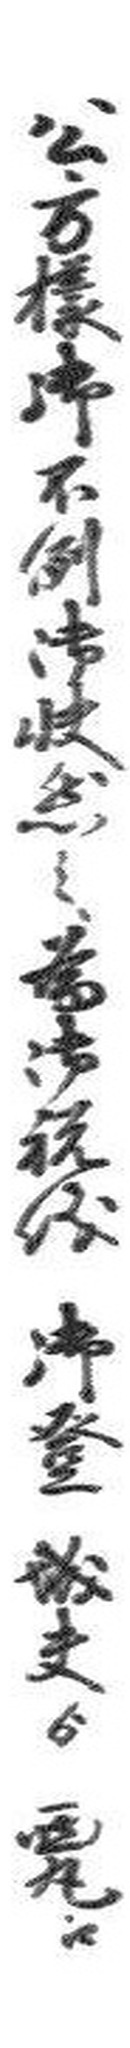公方様御不例御快然之為御祝儀御登城夫ゟ西丸江

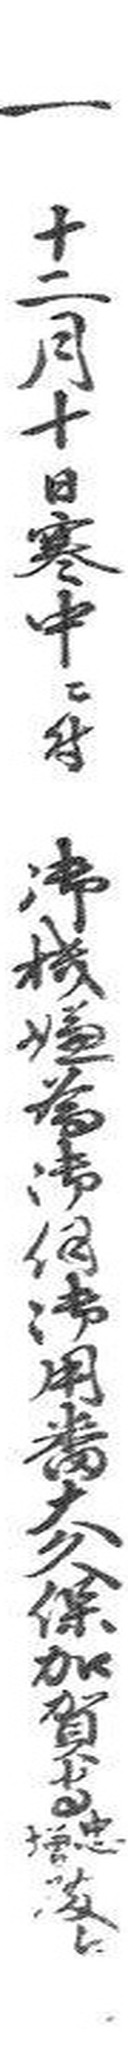一十二月十日寒中ニ付御機嫌為御伺御用番大久保加賀守忠増殿江
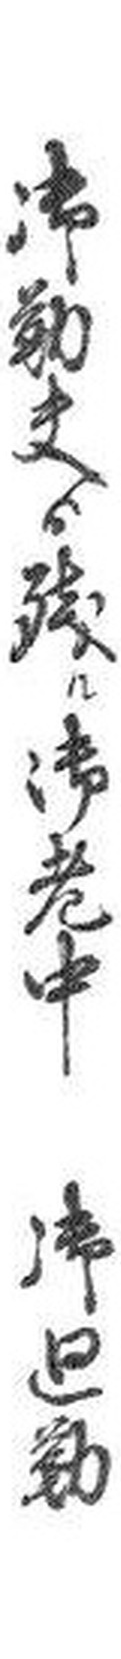御勤夫ゟ残ル御老中御廻勤
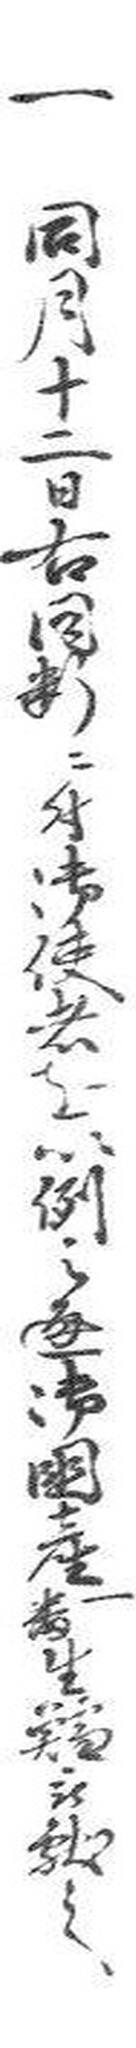一同月十二日右同断ニ付御使者を以例之通御国産一番生鱈被献之
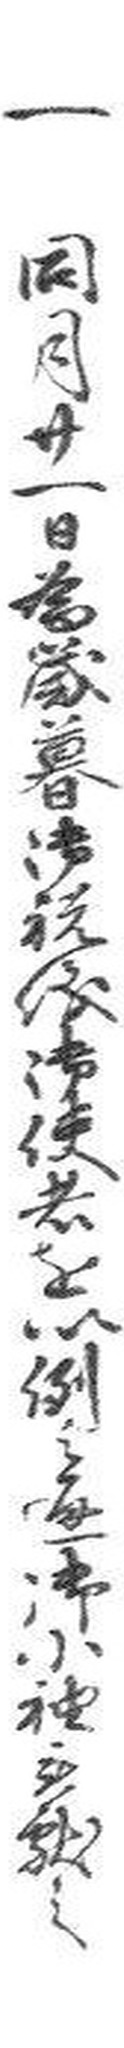一同月廿一日為歳暮御祝儀御使者を以例之通御小袖被献之
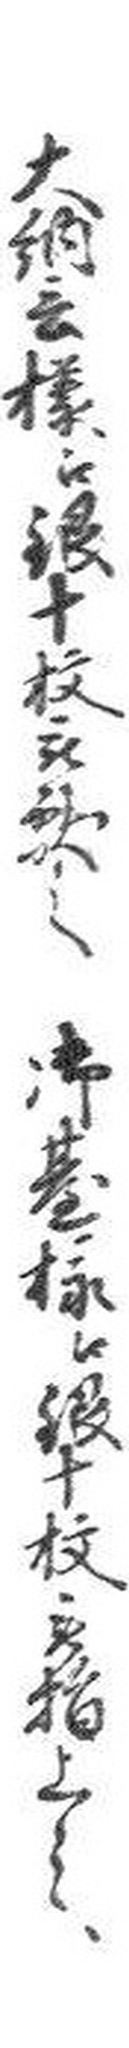大納言様江銀十枚被献之御台様江銀十枚被指上之
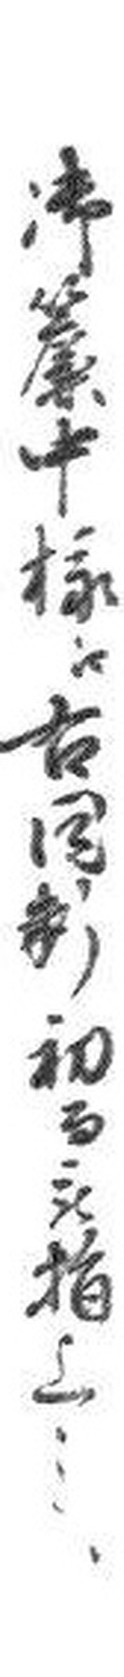御簾中様江右同断初而被指上之
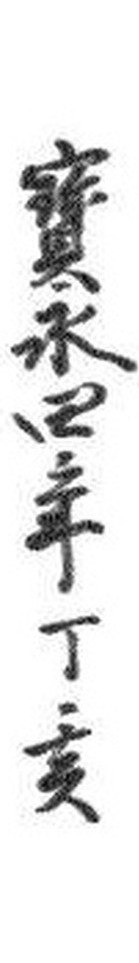宝永四年丁亥
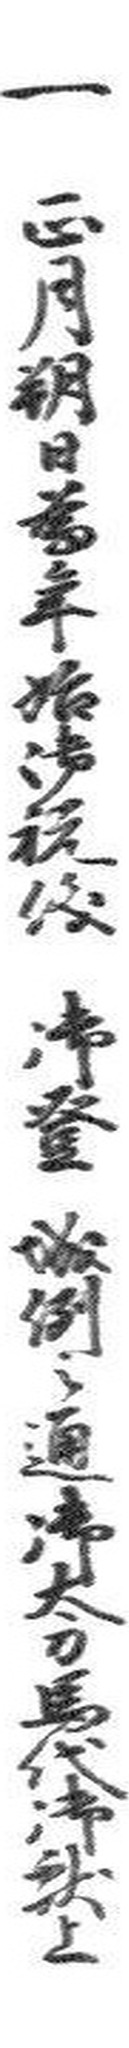一正月朔日為年始御祝儀御登城例之通御太刀馬代御献上
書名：家譜 二十四 吉品公 従宝永三年到同五年
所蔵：福井県文書館 Fukui Prefectural Archives
